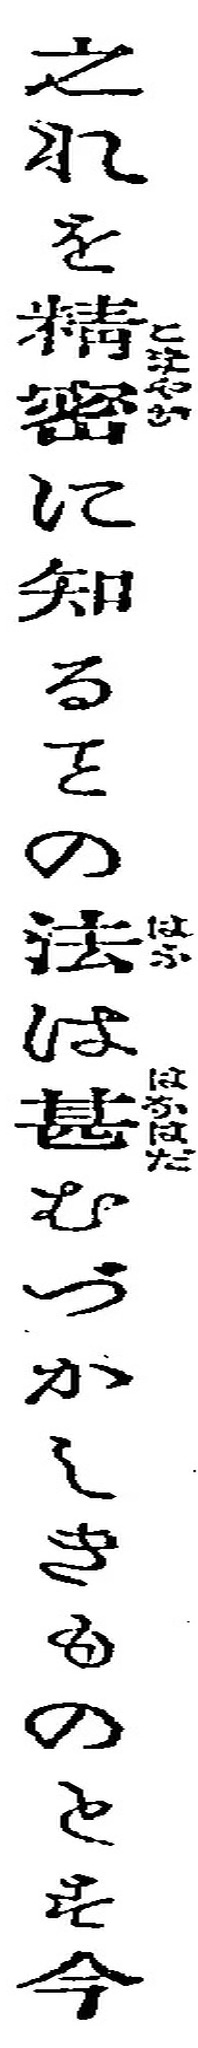之れを精密に知ることの法は甚むづかしきものとす今
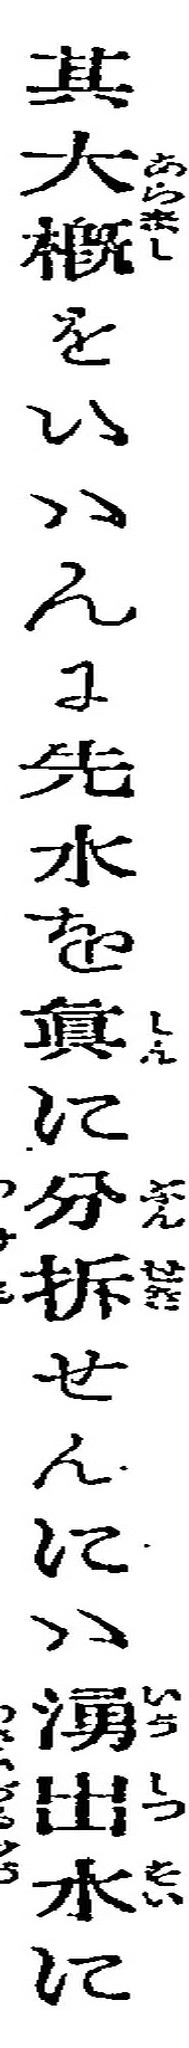其大概をいはんに先水を真に分析せんには湧出水に
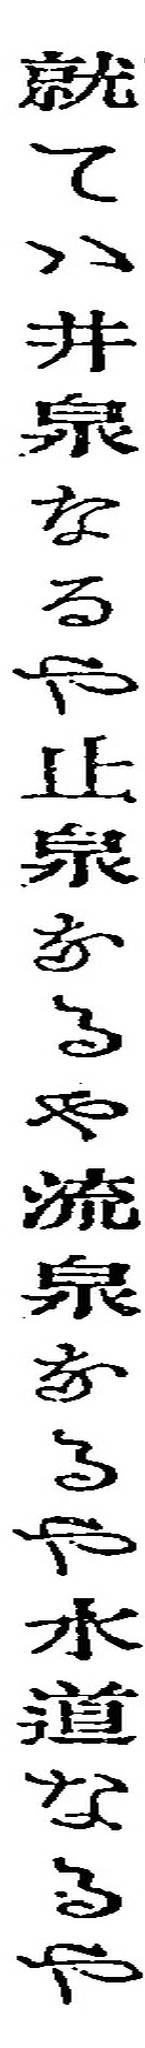就ては井泉なるや止泉なるや流泉なるや水道なるや
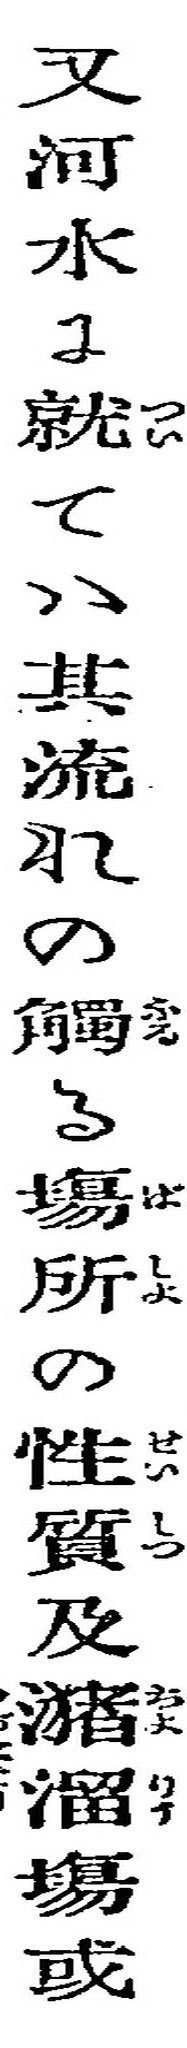又河水に就ては其流れの触る場所の性質及潴溜場或
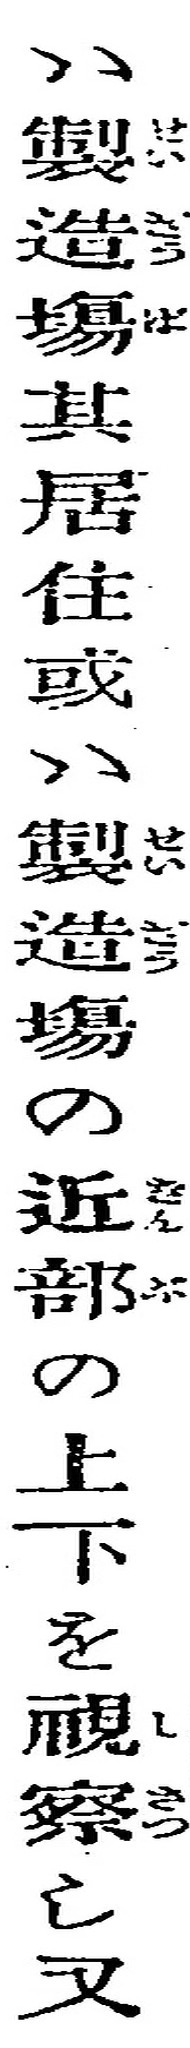は製造場其居住或は製造場の近部の上下を視察し又
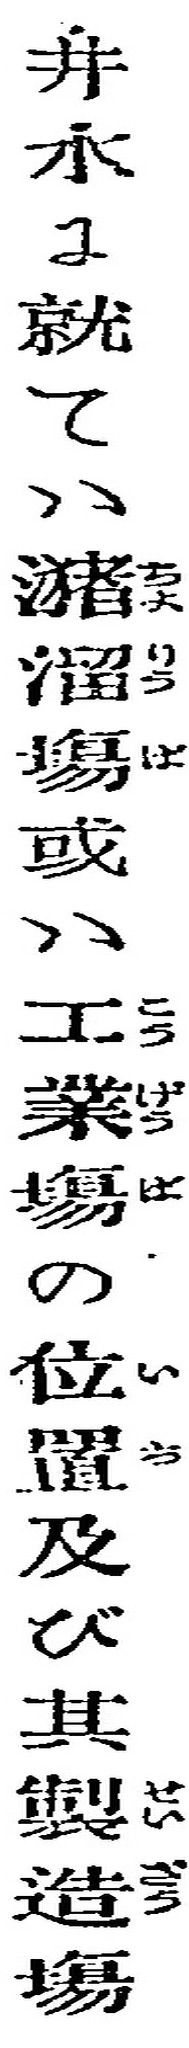井水に就ては潴溜場或は工業場の位置及び其製造場
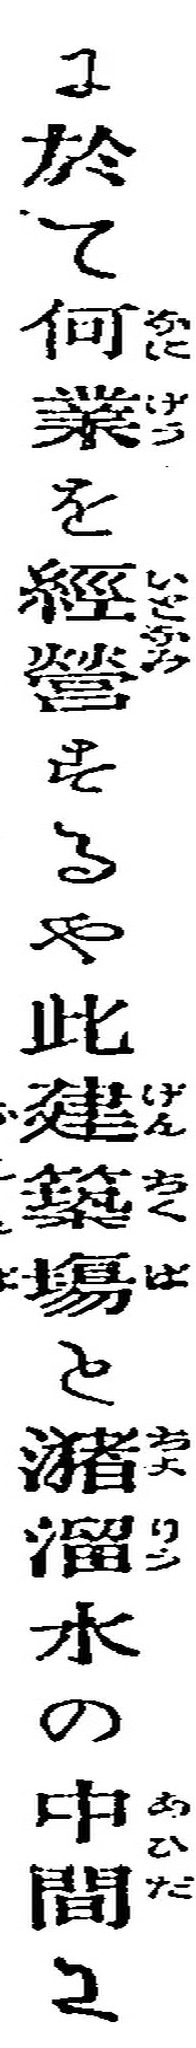に於て何業を経営するや此建築場と潴溜水の中間に
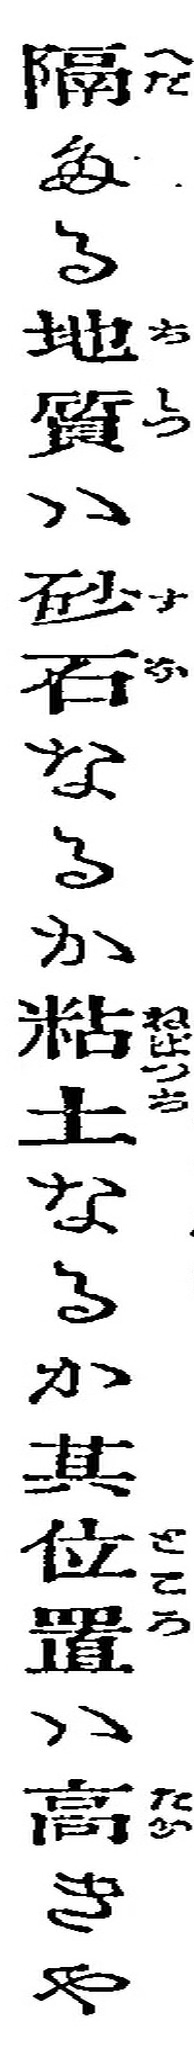隔たる地質は砂石なるか粘土なるか其位置は高きや
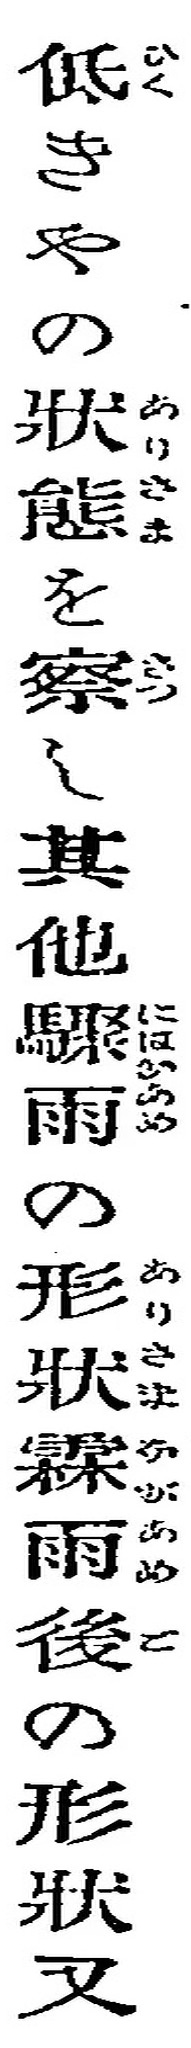低きやの状態を察し其他驟雨の形状霖雨後の形状又
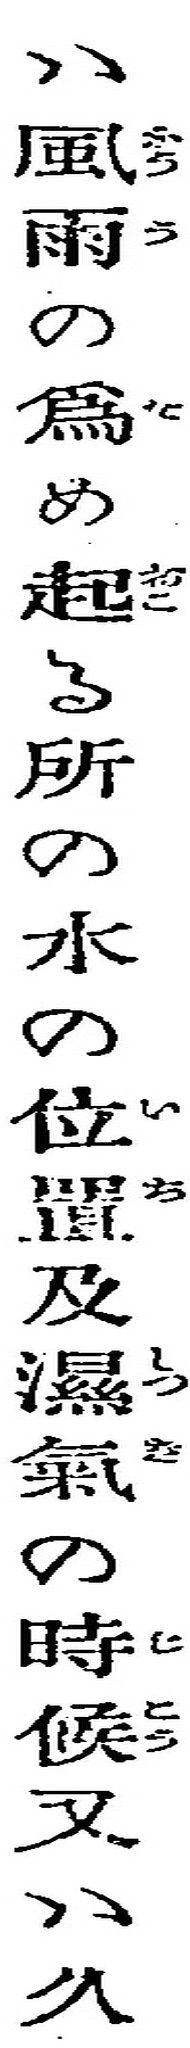は風雨の為め起る所の水の位置及湿気の時候又は久

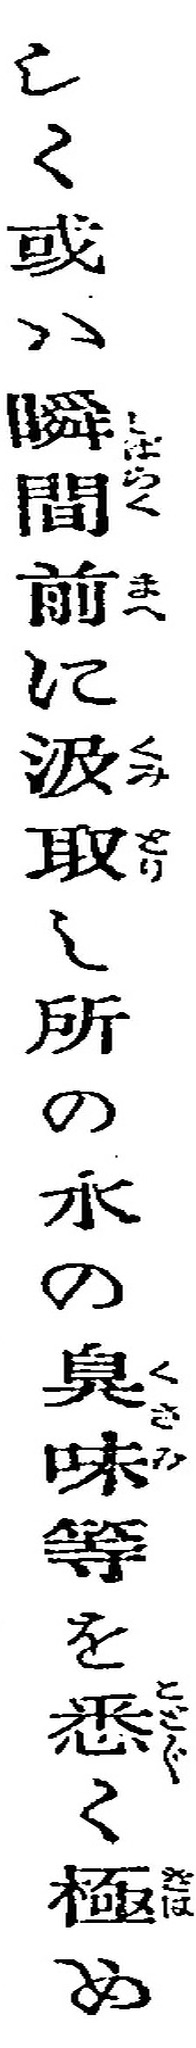しく或は瞬間前に汲取し所の水の臭味等を悉く極め
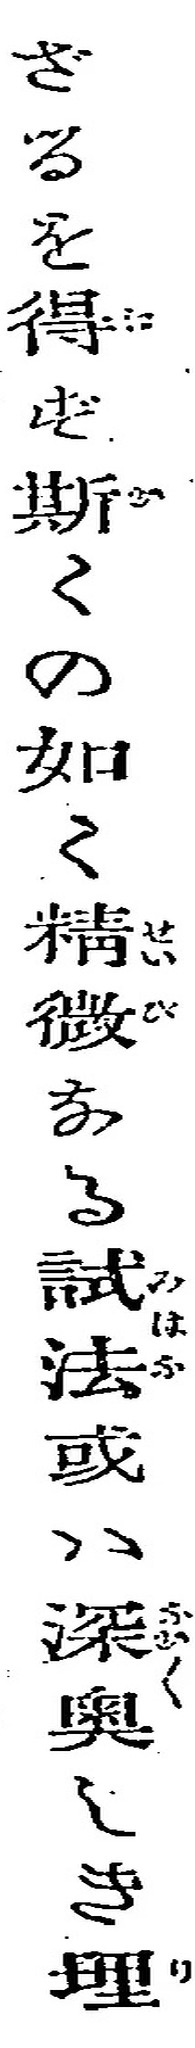ざるを得ず斯くの如く精微なる試法或は深奥しき埋
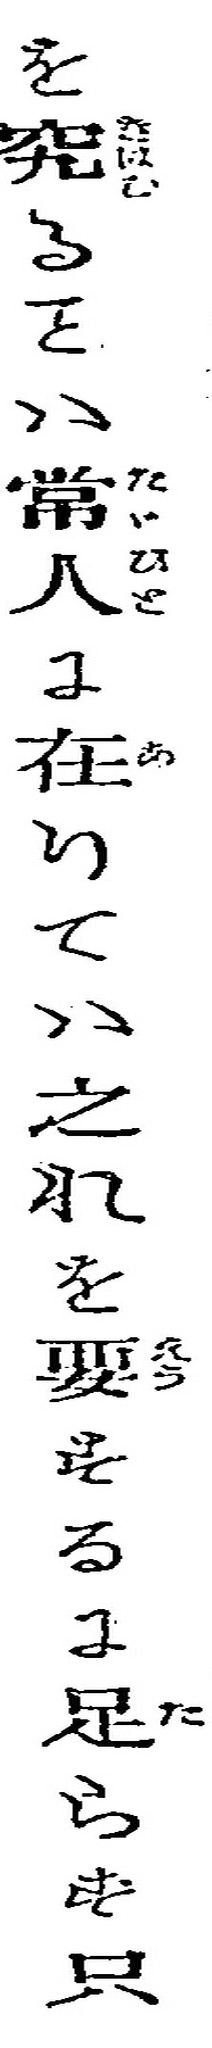を究ることは常人に在りては之れを要するに足らず只
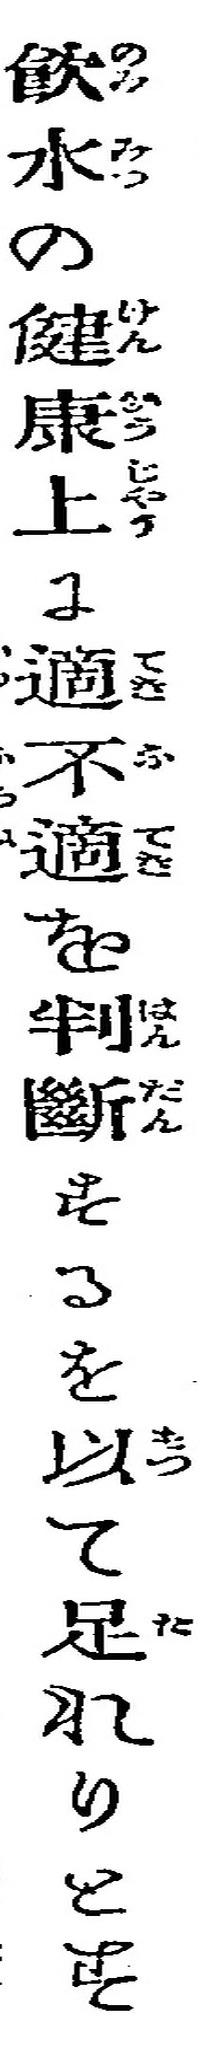飲水の健康上に適不適を判断するを以て足れりとす
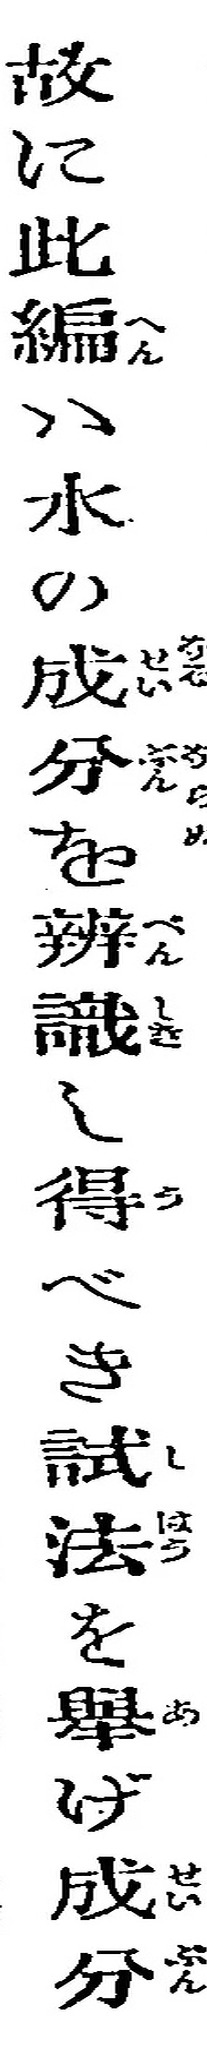故に此編は水の成分を辨識し得べき試法を挙げ成分
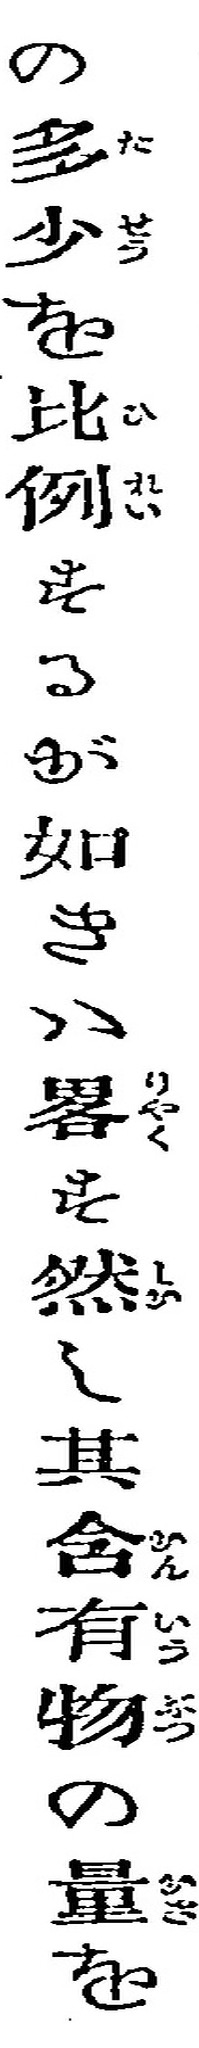の多少を比例するが如きは畧す其含有物の量を
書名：飲水の心得 : 伝染病の予防
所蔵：国立国会図書館 National Diet Library, JAPAN
